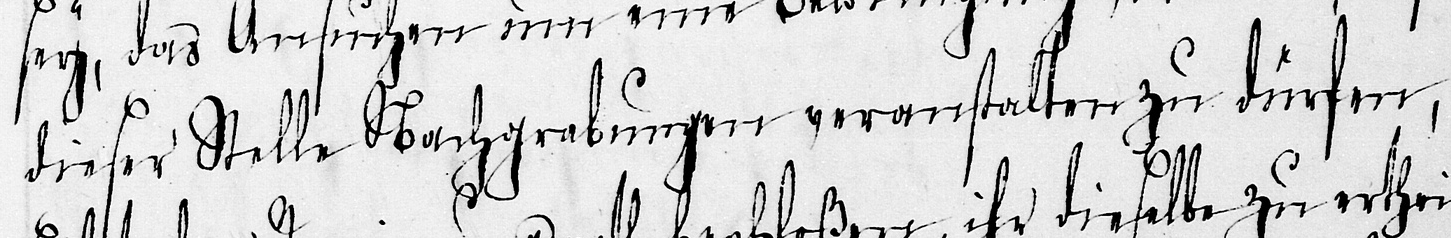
dieser Stelle Nachgrabungen veranstalten zu dürfen,
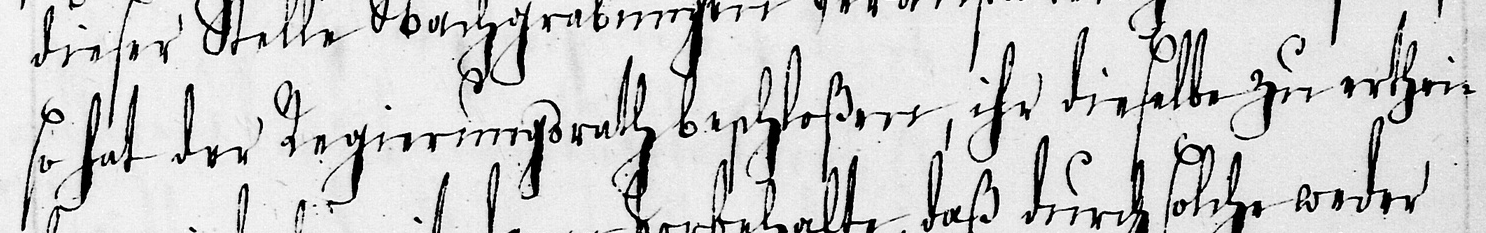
so hat der Regierungsrath beschloßen, ihr dieselbe zu erthe¬
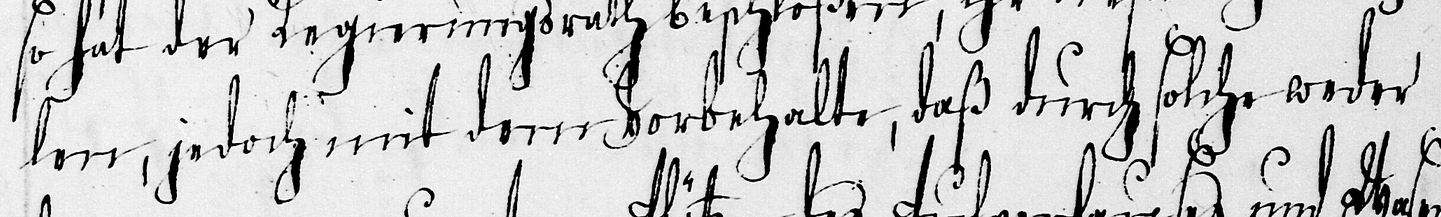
ilen, jedoch mit dem Vorbehalte, daß durch solche weder
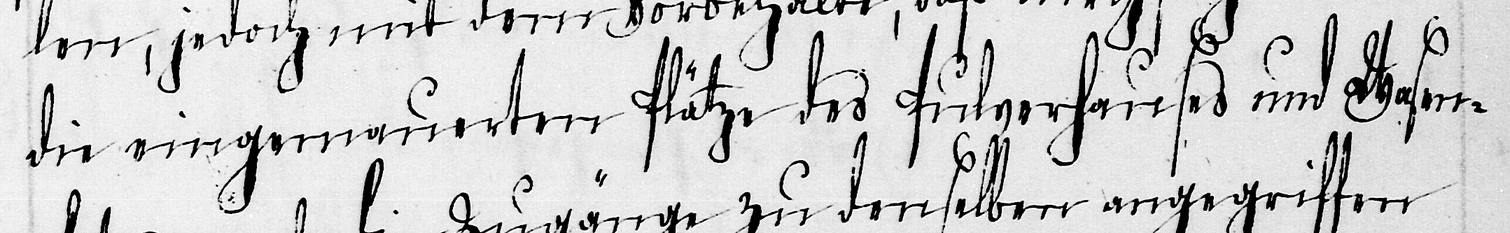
die eingemauerten Plätze des Pulverhauses und Wasen¬
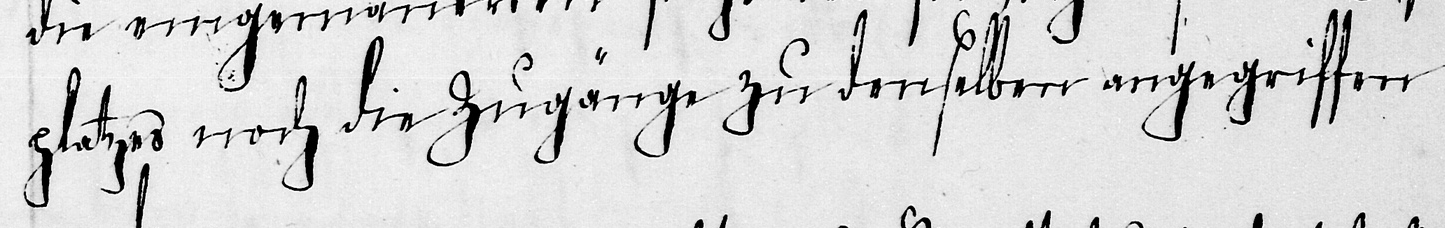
platzes noch die Zugänge zu denselben angegriffen
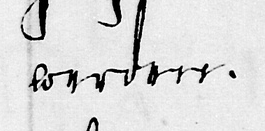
werden.
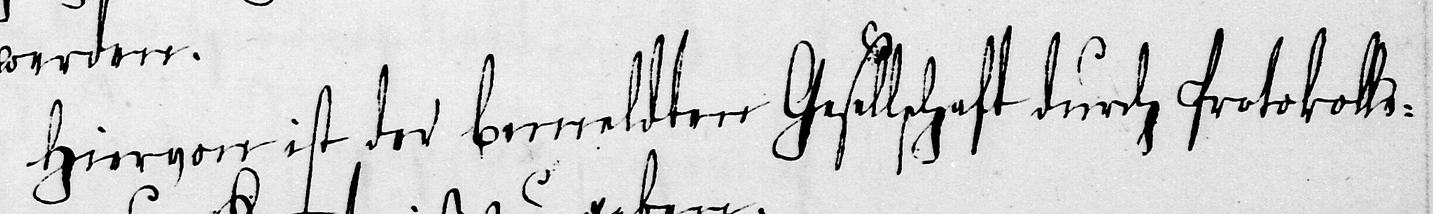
Hiervon ist der bemeldten Gesellschaft durch Protokol¬
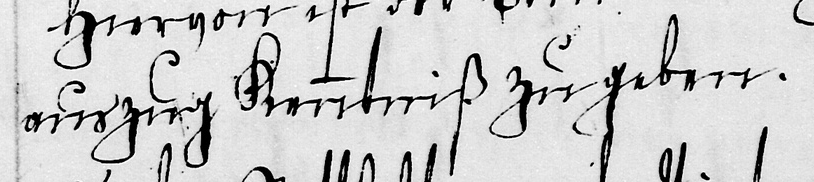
auszug Kenntniß zu geben.
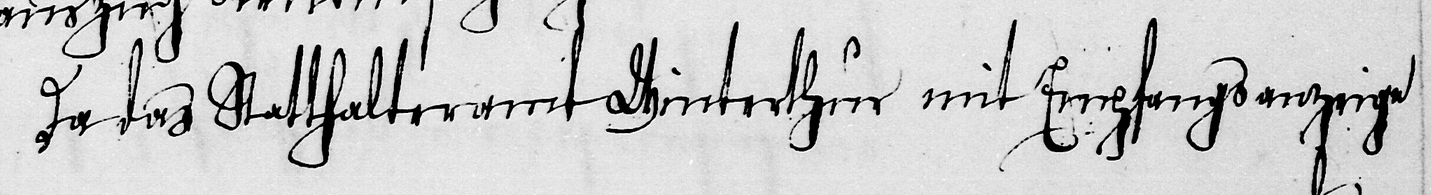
Da das Statthalteramt Winterthur mit Empfangsanzeige
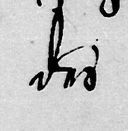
der
